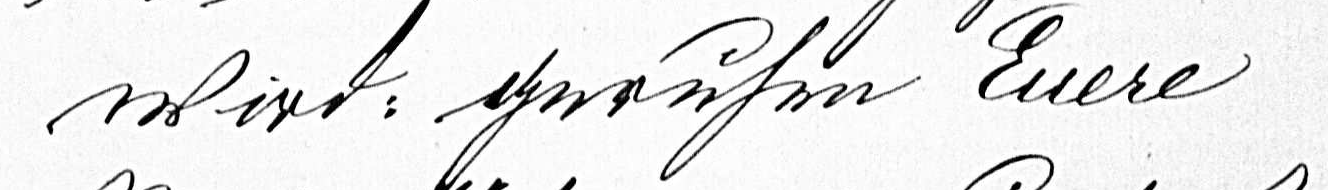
wird: geruhen Euere
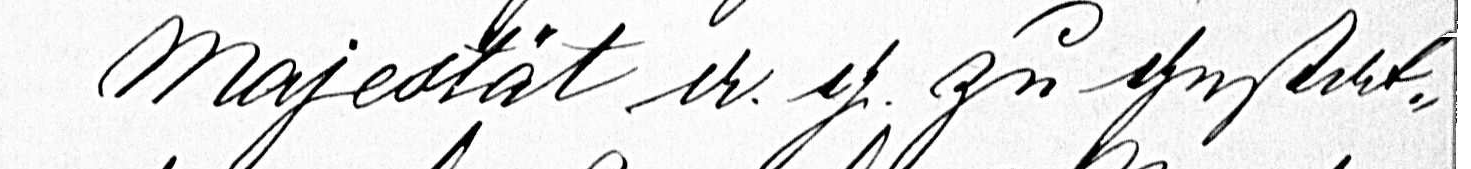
Majestät a. g. zu gestat¬
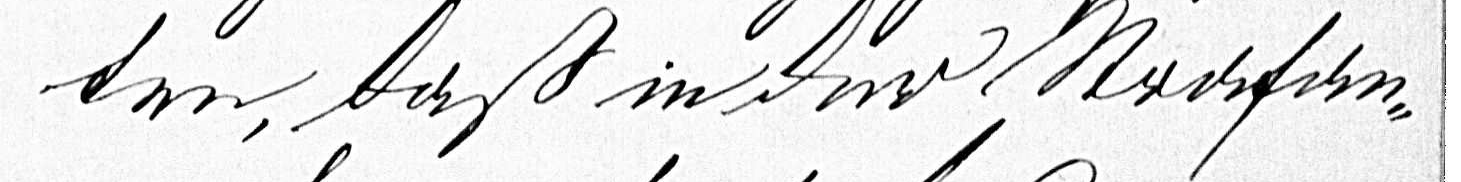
ten, daß in der Strafan¬
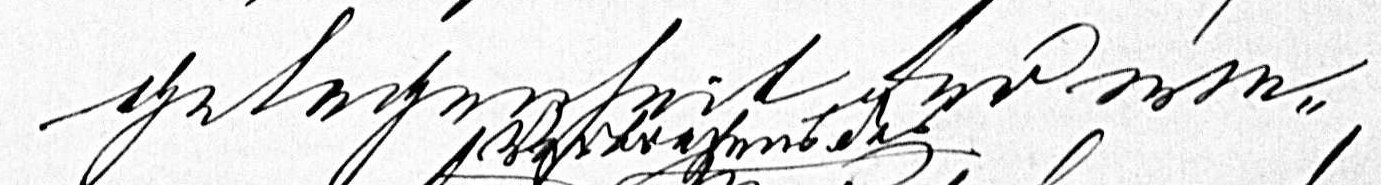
gelegenheit der we¬
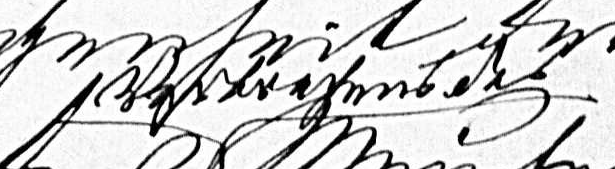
Verbrechendes
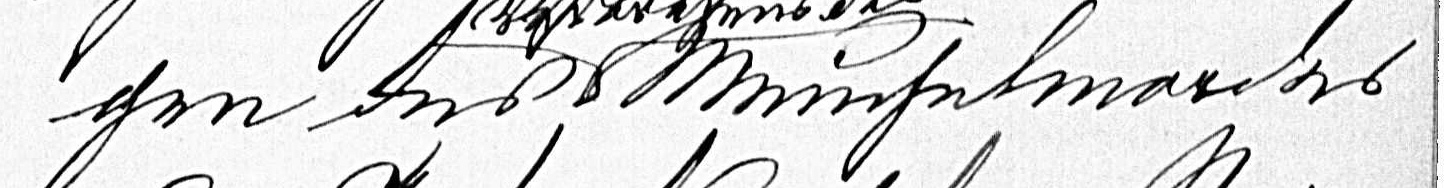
gen des Meuchelmordes
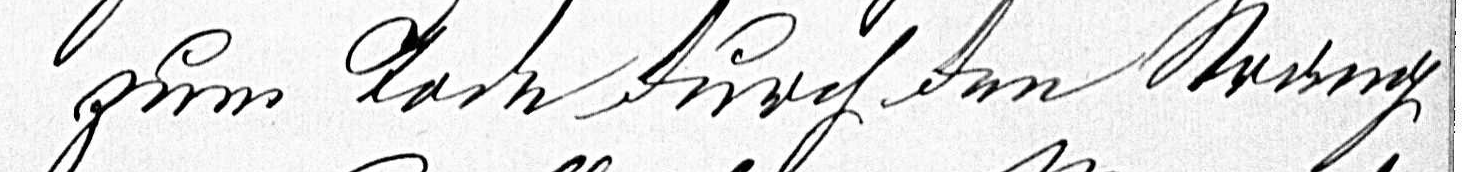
zum Tode durch den Strang
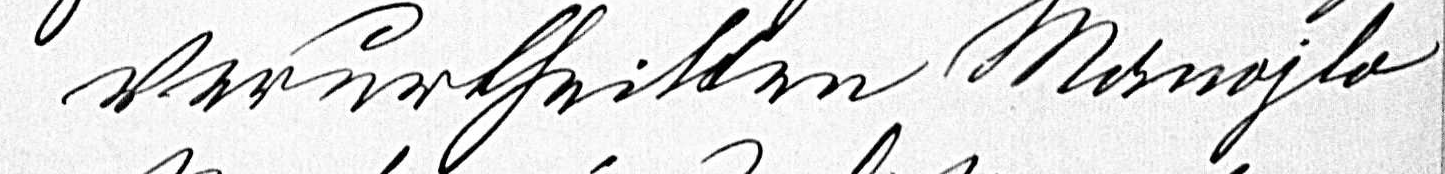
verurtheilten Manojlo
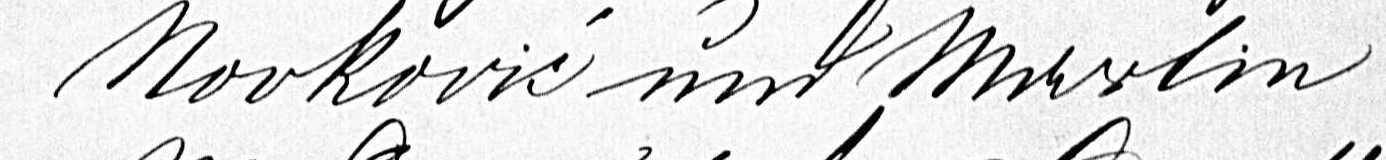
Novković und Martin
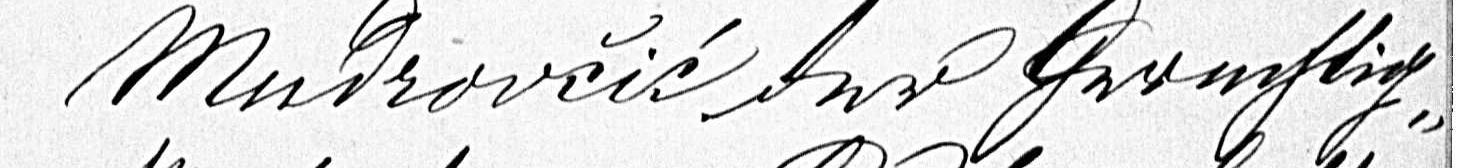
Mudrovčić der Gerechtig¬
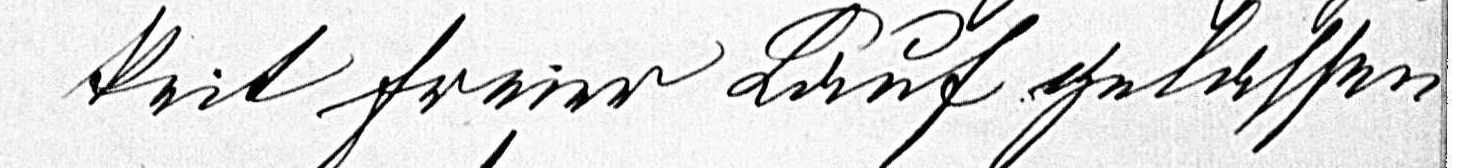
keit freier Lauf gelassen
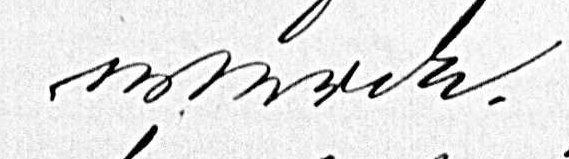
werde.
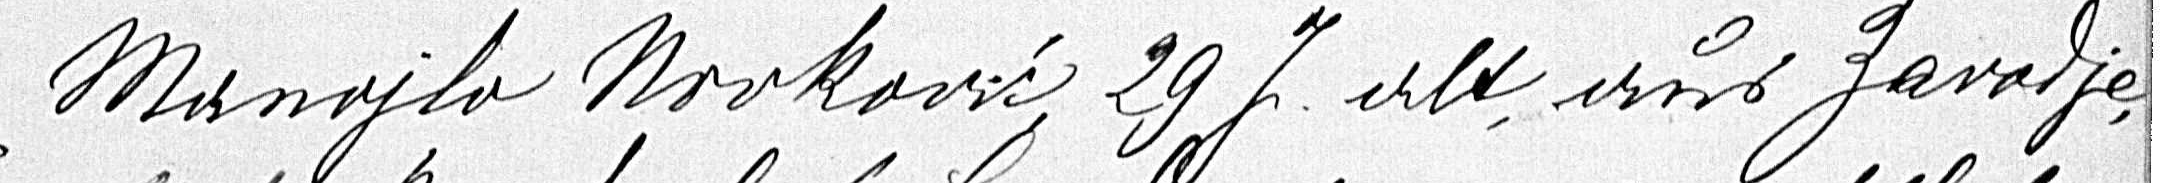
Manojlo Novković 29 J. alt, aus Zavodje,
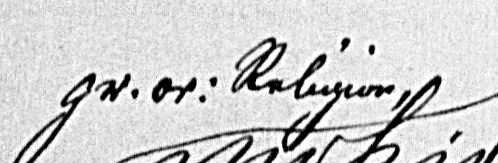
gr. or: Religion
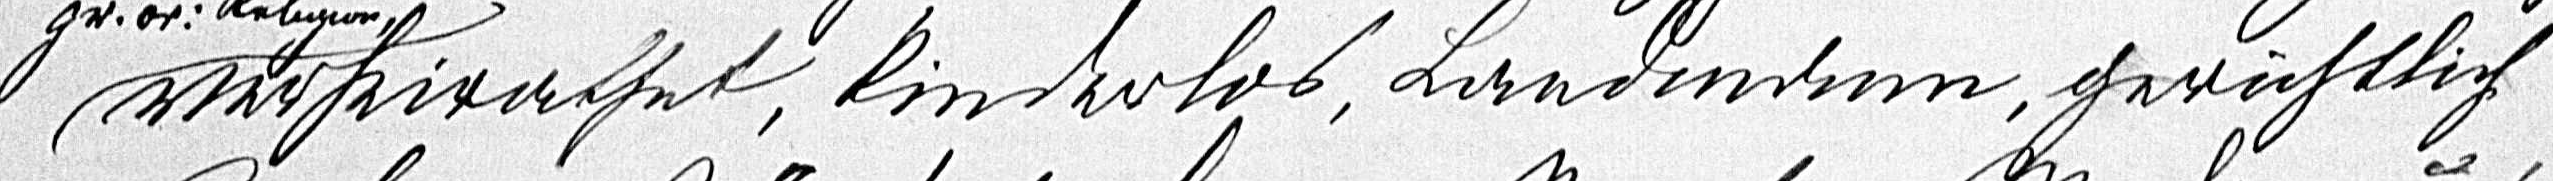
verheirathet, kinderlos, Landmann, gerichtlich
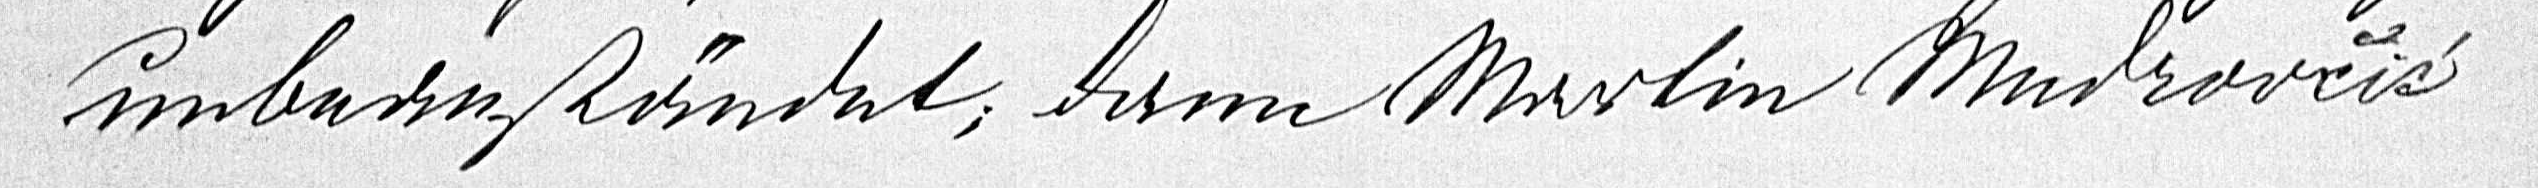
unbeanständet; dann Martin Mudrovčić
